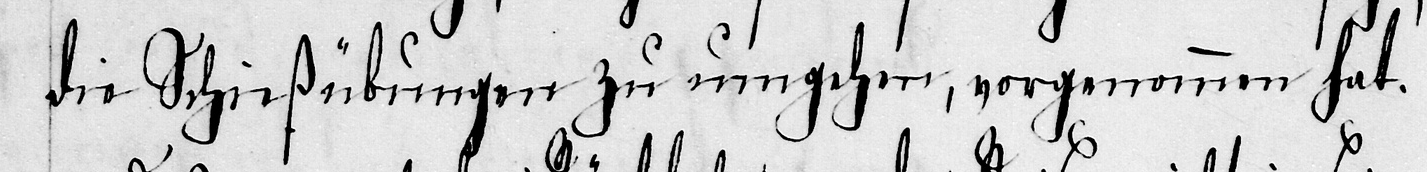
die Schießübungen zu umgehen, vorgenommen hat.
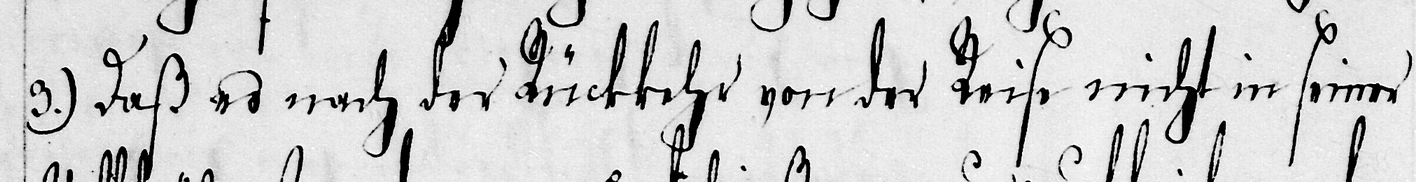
3.) Daß es nach der Rückkehr von der Reise nicht in sein¬
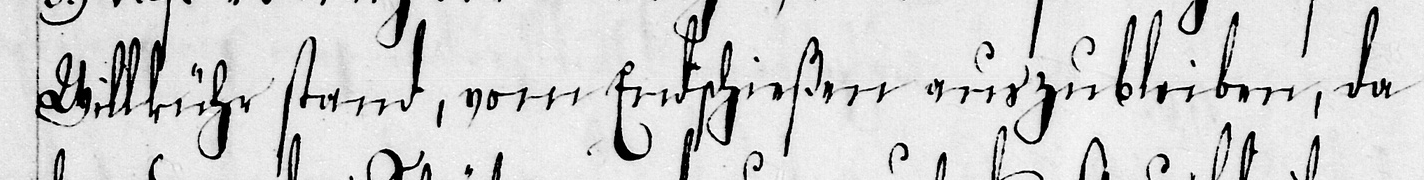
Willkühr stand, vom Endschießen auszubleiben, da
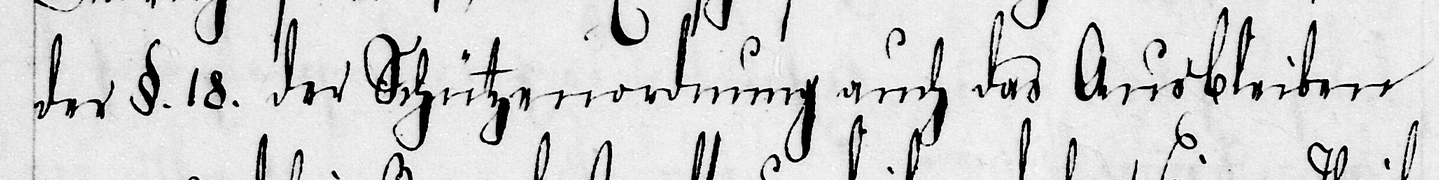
der §. 18 der Schützenordnung auch das Ausbleiben
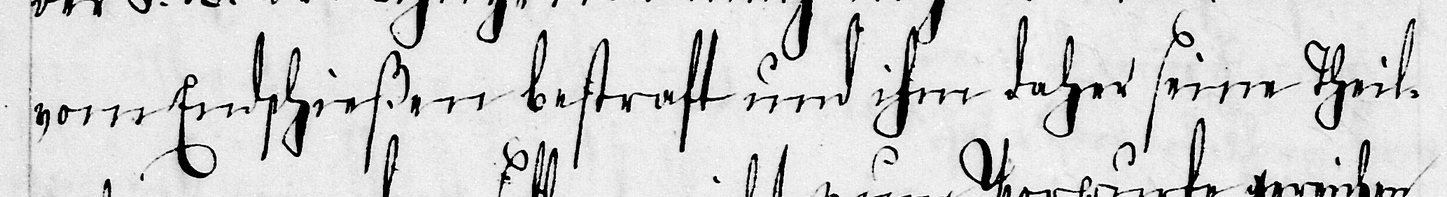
vom Endschießen bestraft und ihm daher seine Theil¬
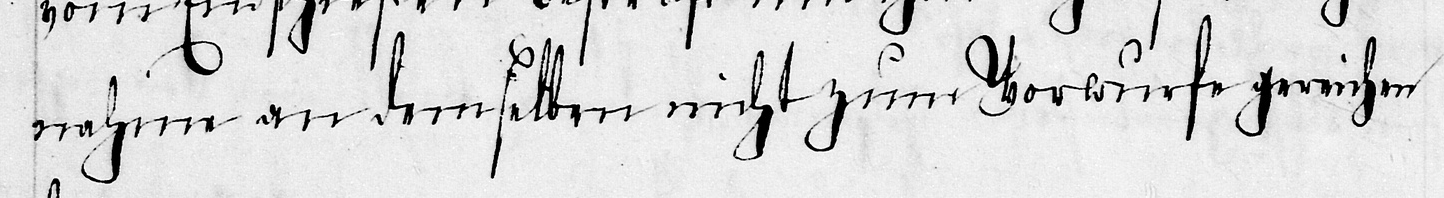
nahme an demselben nicht zum Vorwurfe gereichen
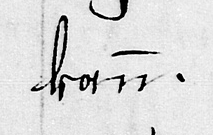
kann.
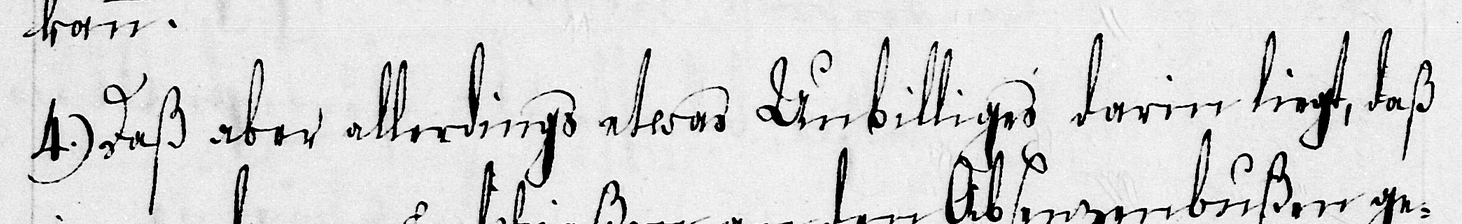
4.) Daß aber allerdings etwas Unbilliges darin liegt, daß
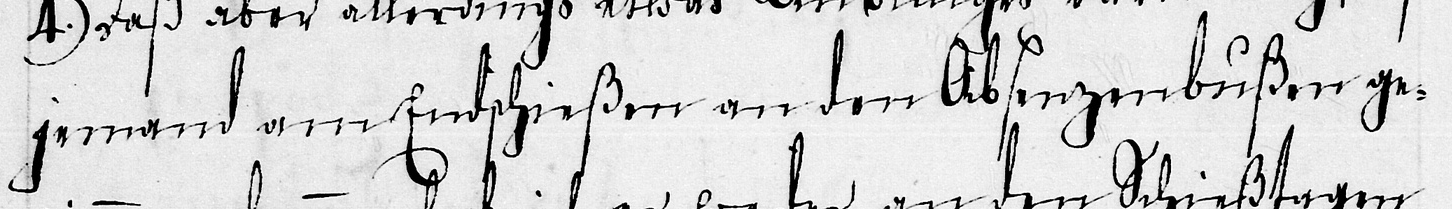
jemand am Endschießen an den Absenzenbußen ge¬
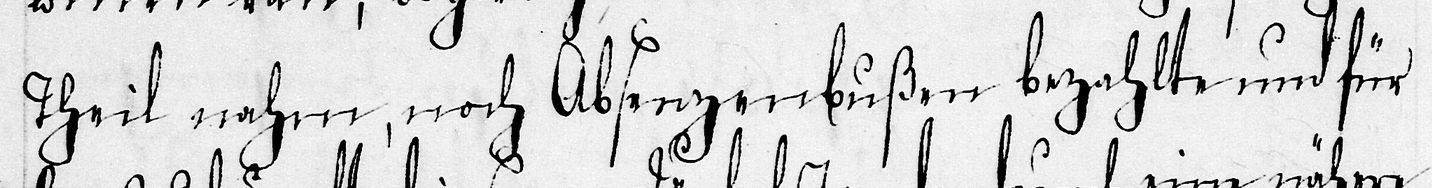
Theil nahm, noch Absenzenbußen bezahlte und für
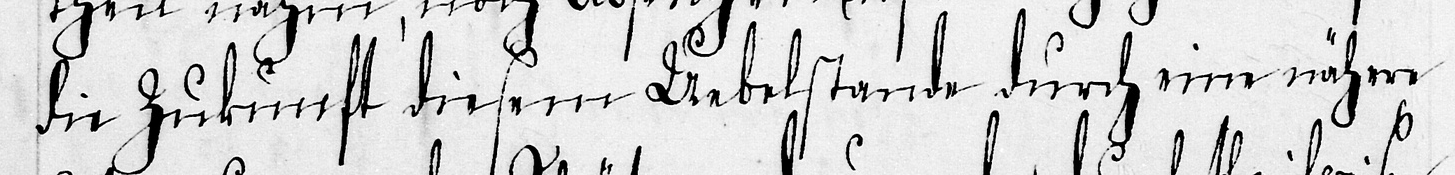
die Zukunft diesem Uebelstande durch eine nähere
